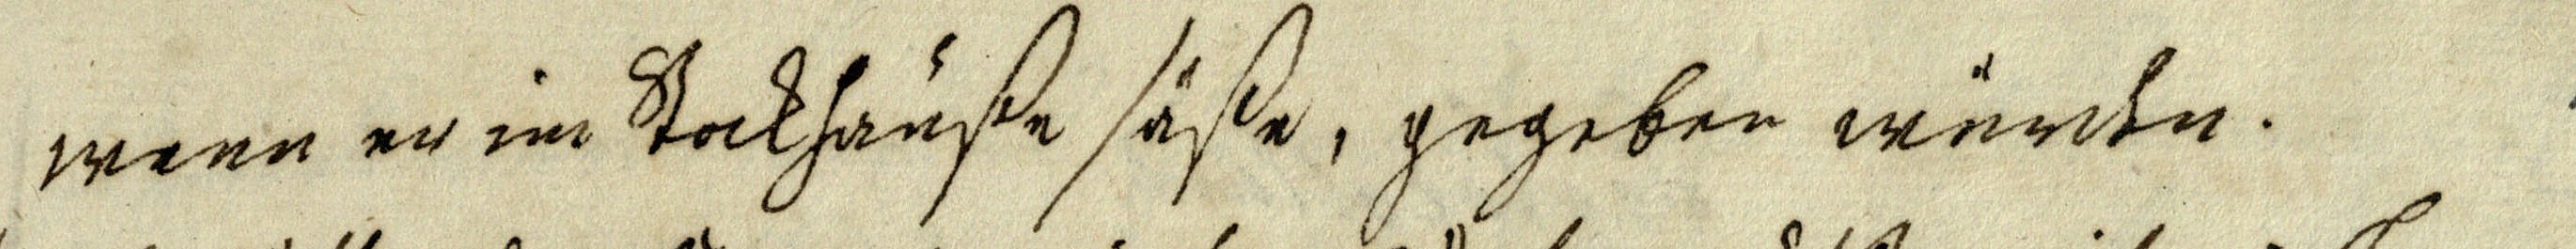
wenn er im Stockhauße säße, gegeben würden.
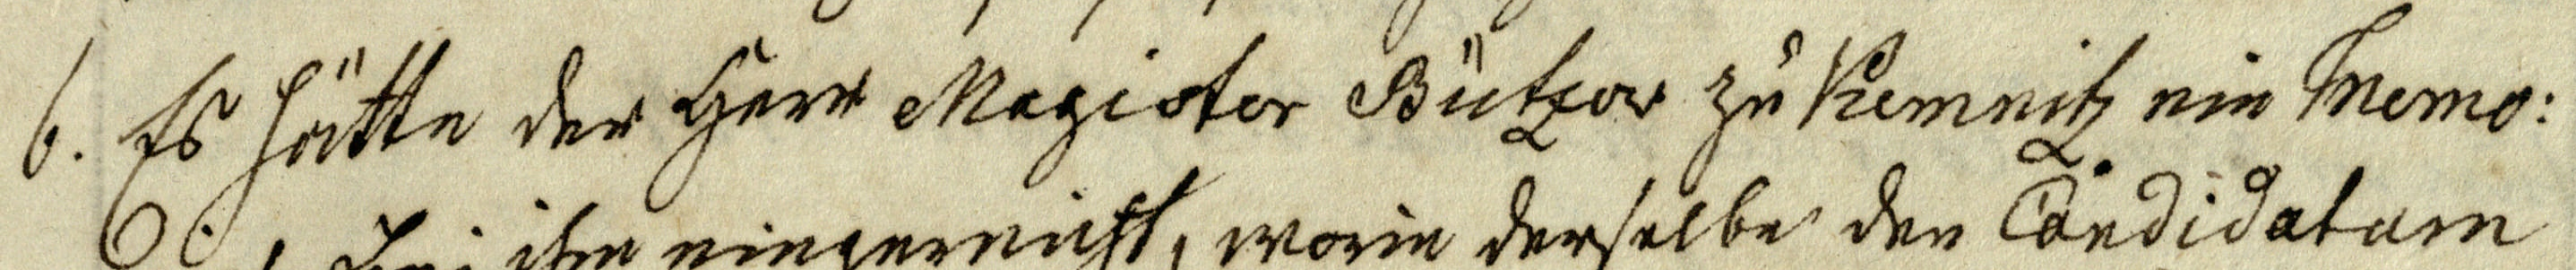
6. Es hätte der Herr Magister Bützow zu Kemnitz ein Memo¬
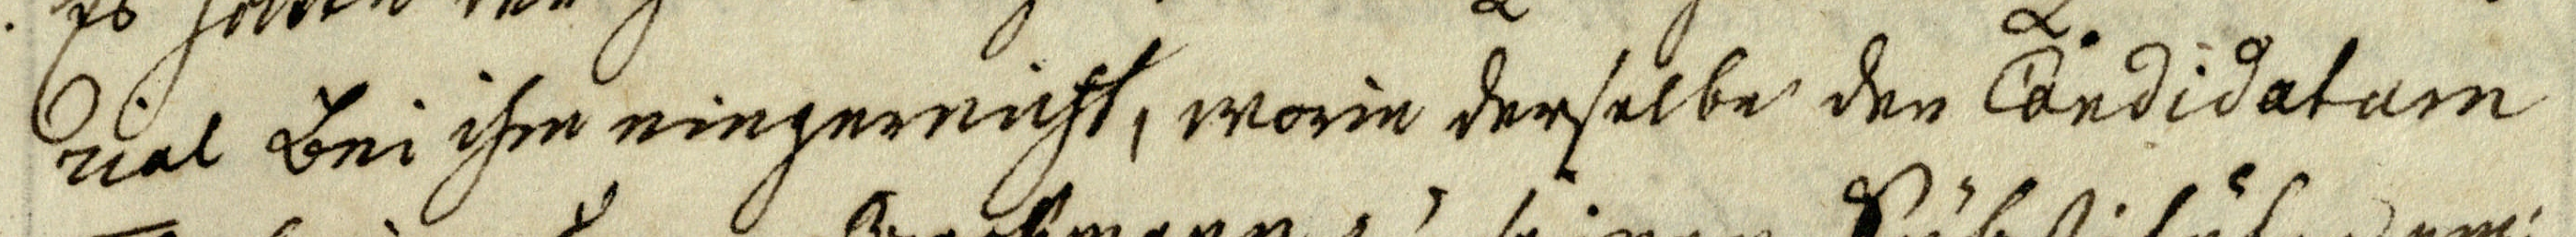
rial bei ihm eingereicht, worin derselbe den Candidatum
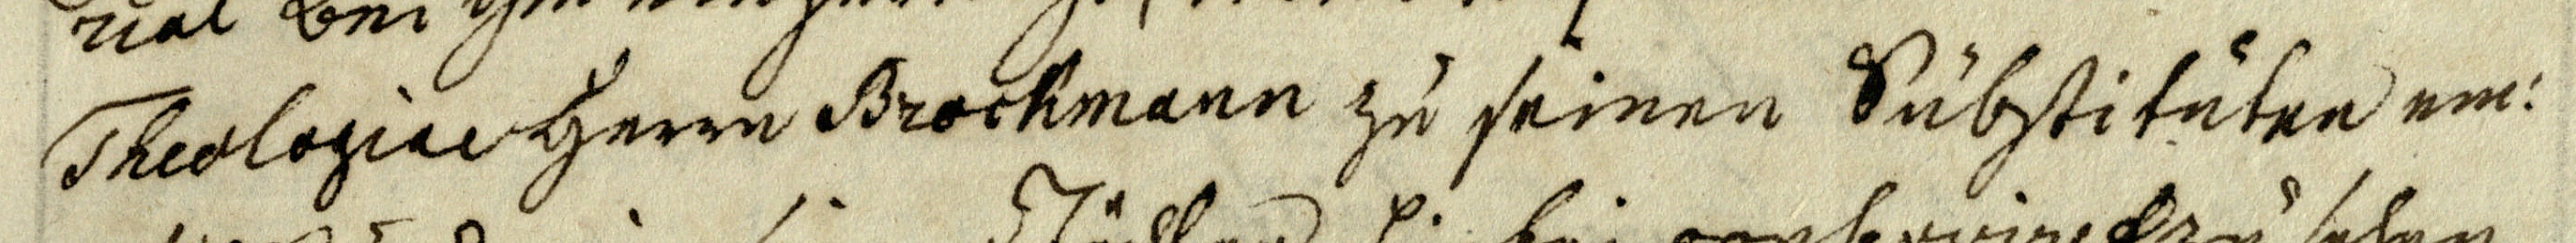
Theologiae Herrn Brockmann zu seinem Substituten em¬
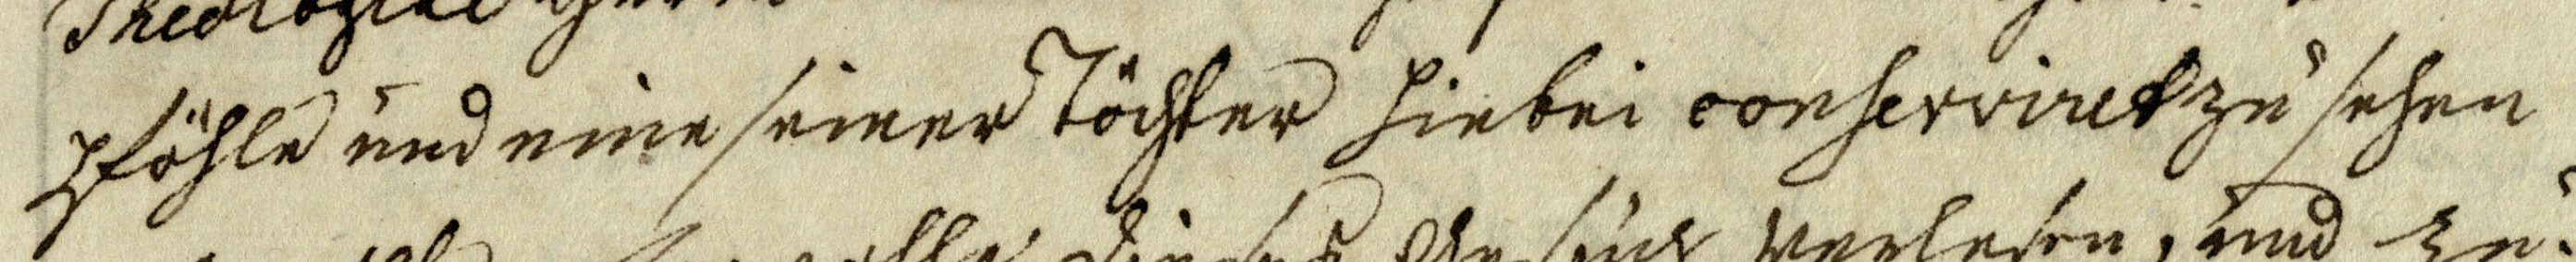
pföhle und eine seiner Töchter hiebei conserviret zu sehen
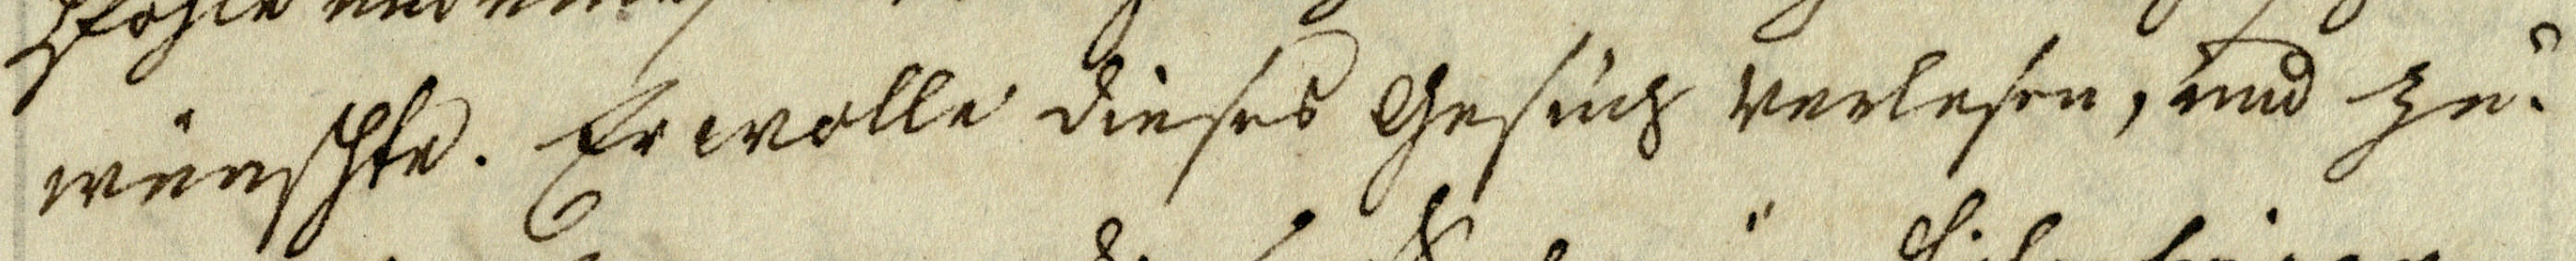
wünschte. Er wolle dieses Gesuch verlesen, und zu¬
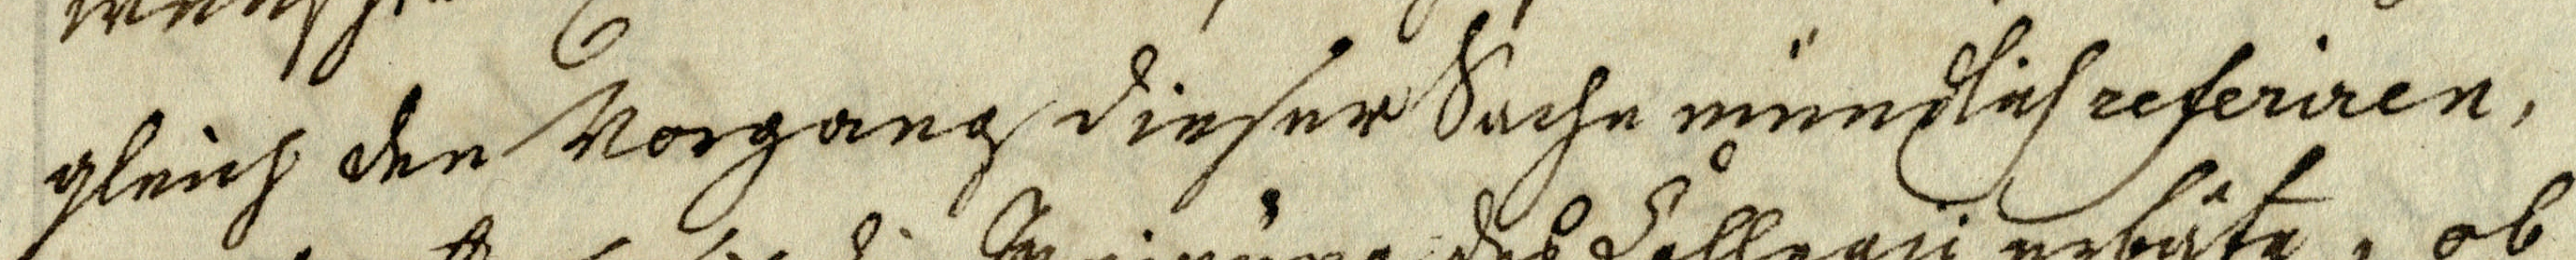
gleich den Vorgang dieser Sache mündlich referiren,
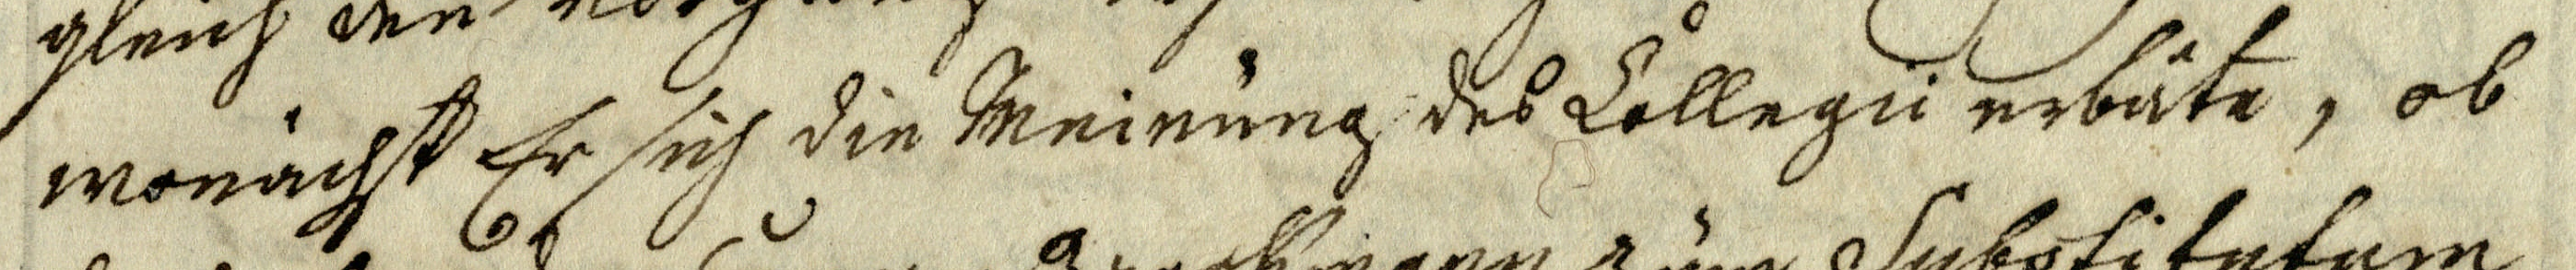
wonächst Er sich die Meinung des Collegii erbäte, ob
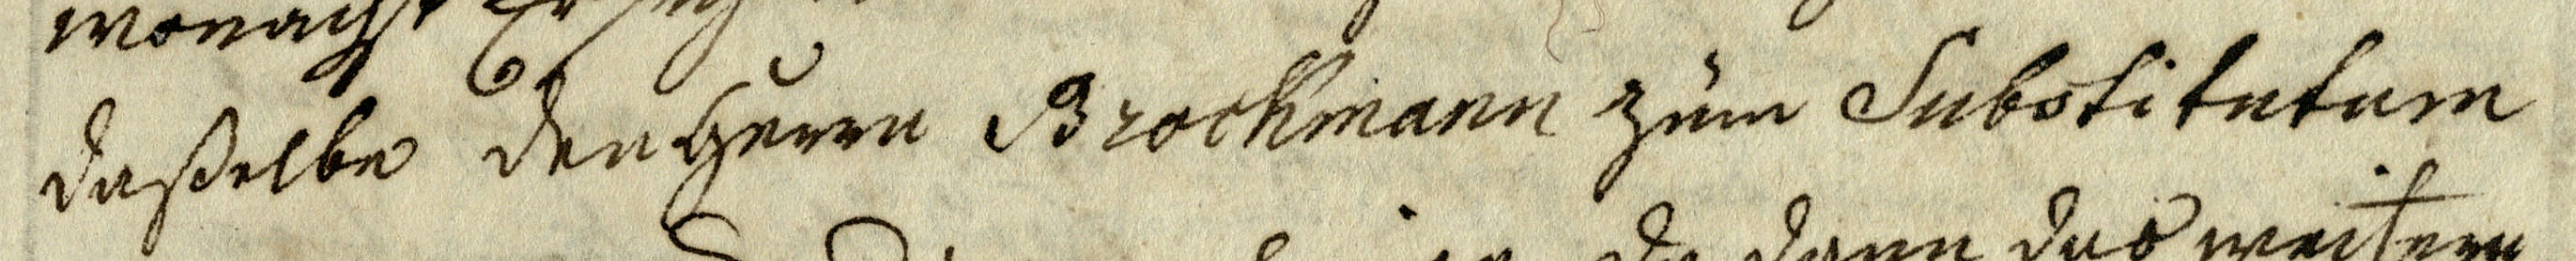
daßelbe den Herrn Brockmann zum Substitutum
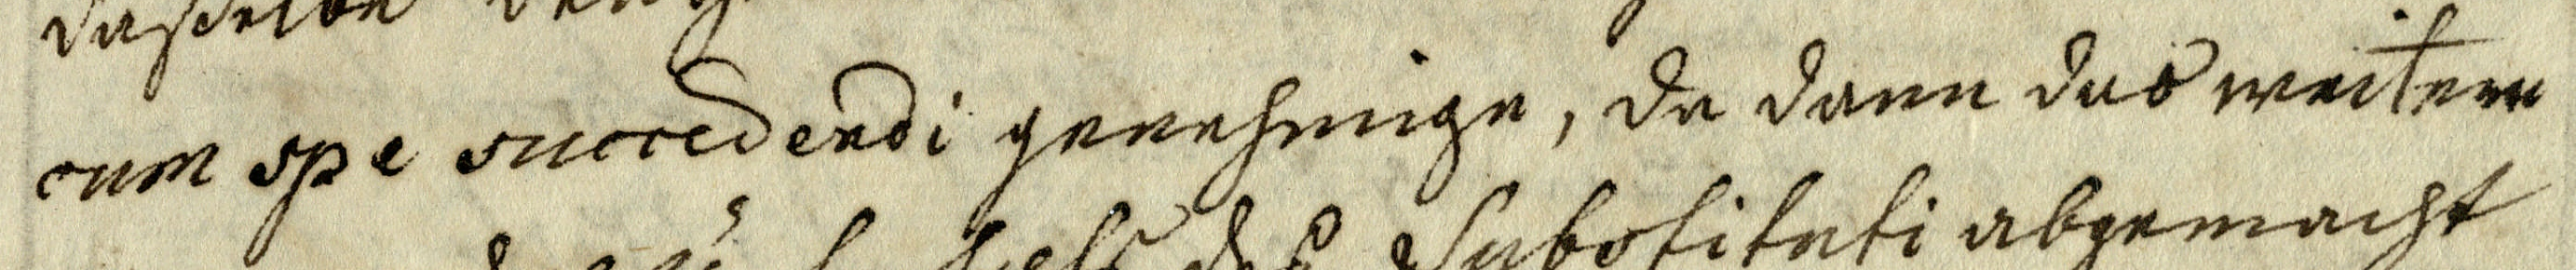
cum spe succedendi genehmige, da dann das weitere
